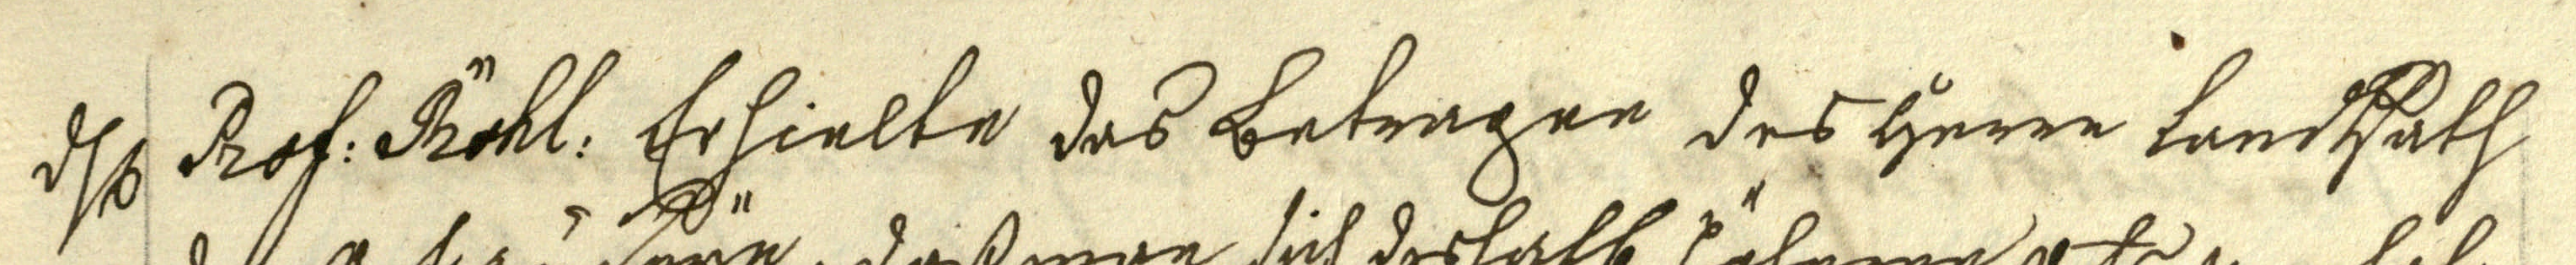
dh Prof. Röhl. Er hielte das Betragen des Herrn LandRath
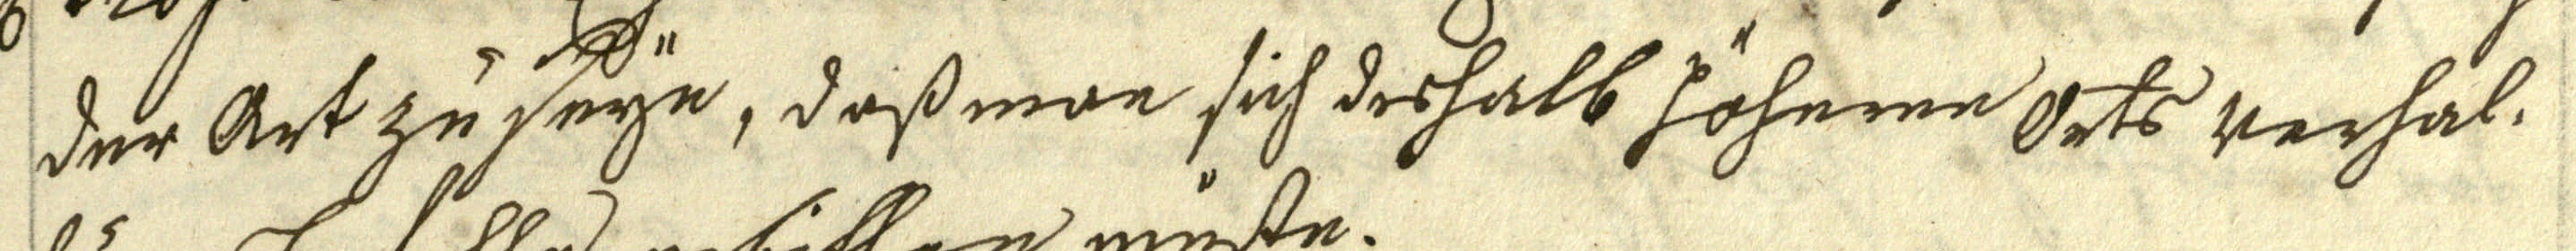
der Art zu seÿn, daß man sich deshalb höheren Orts verhal¬
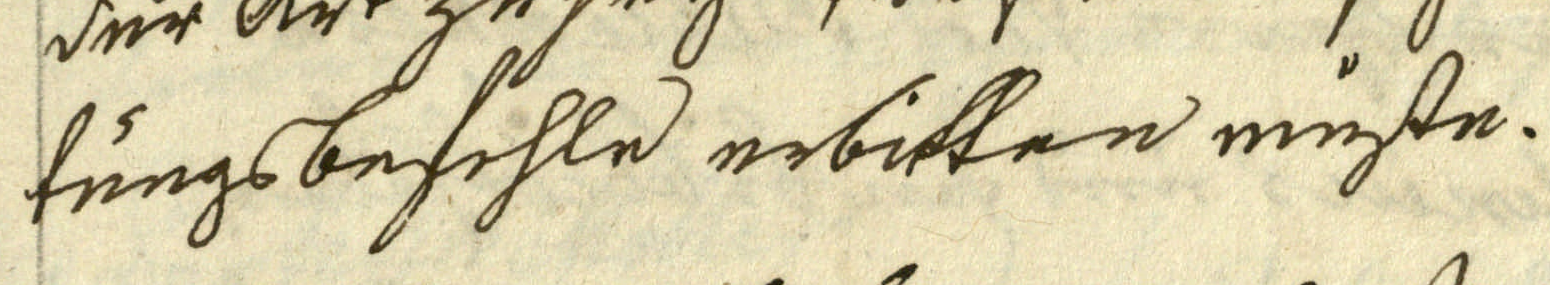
tungsbefehle erbitten müste.
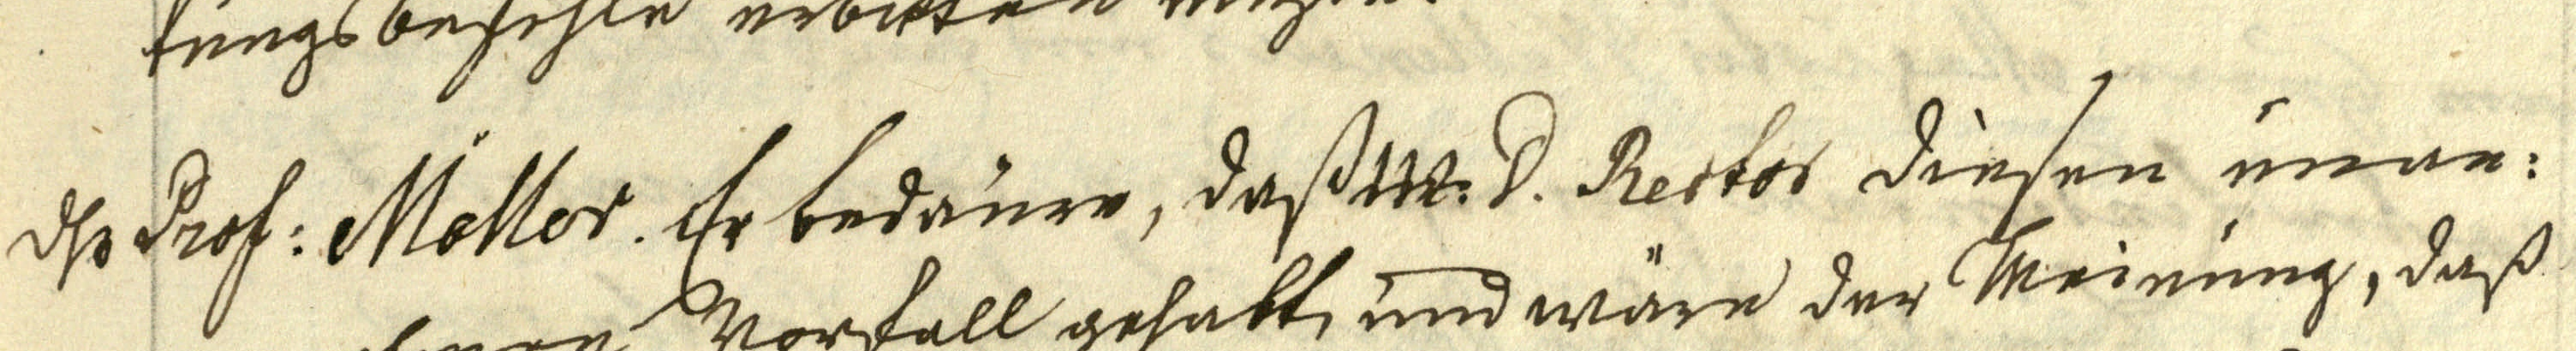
dh Prof. Möller. Er bedaure, daß M. D. Rector diesen unan¬
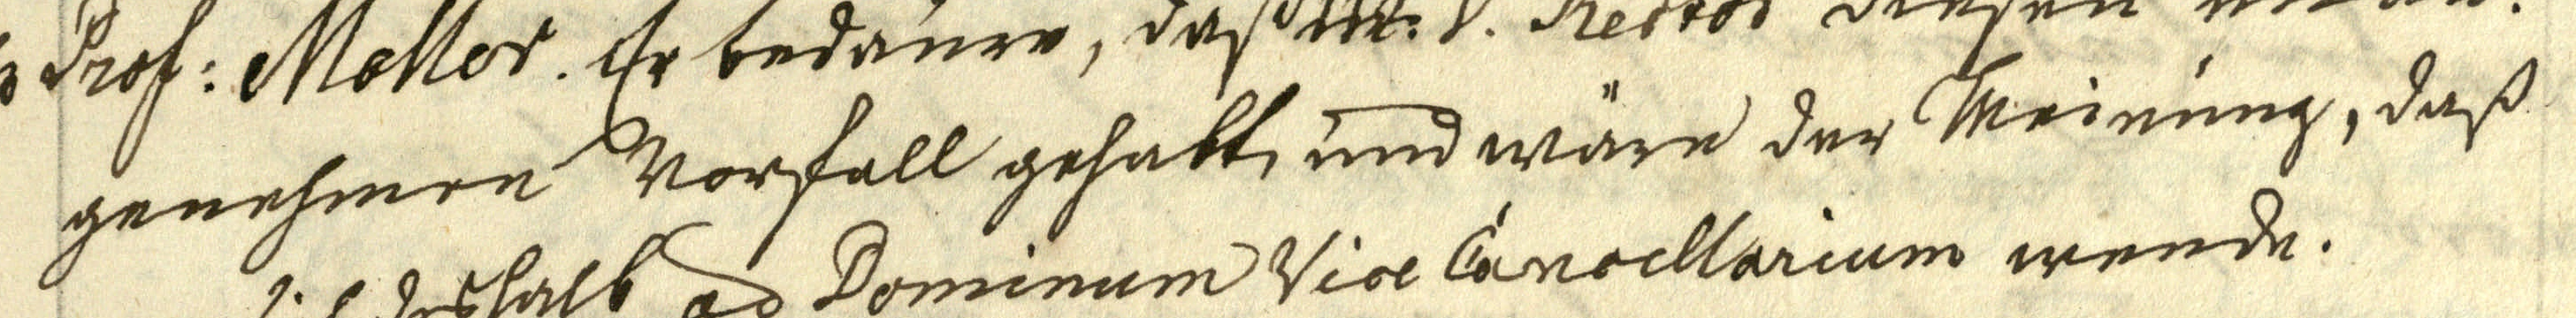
genehmen Vorfall gehabt, und wäre der Meinung, daß
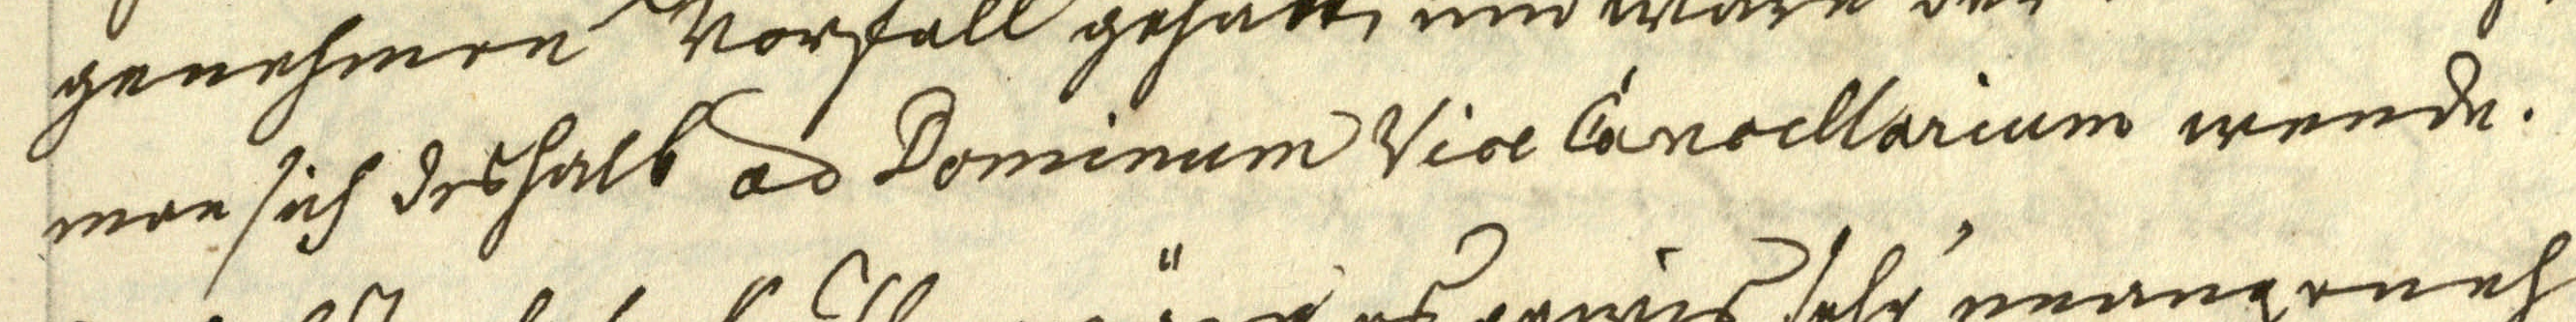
man sich deshalb ad Dominum Vice Cancellarium wende.
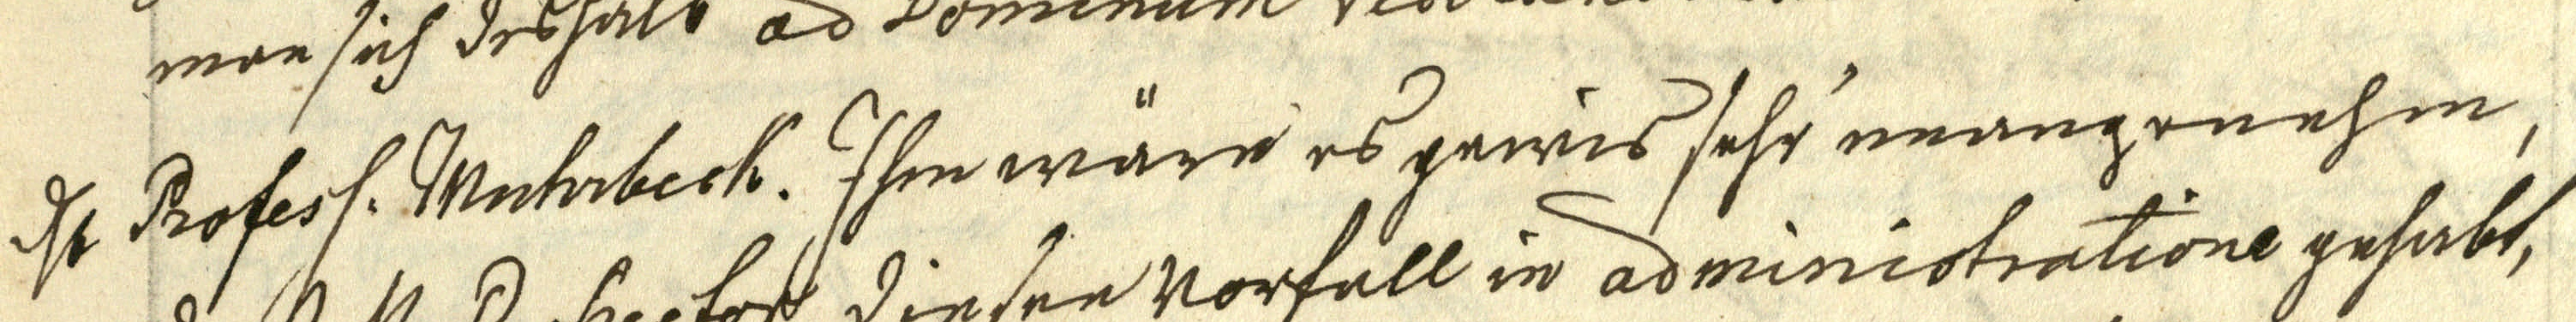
dh Profesor. Muhrbeck. Ihm wäre es gewis sehr unangenehm,
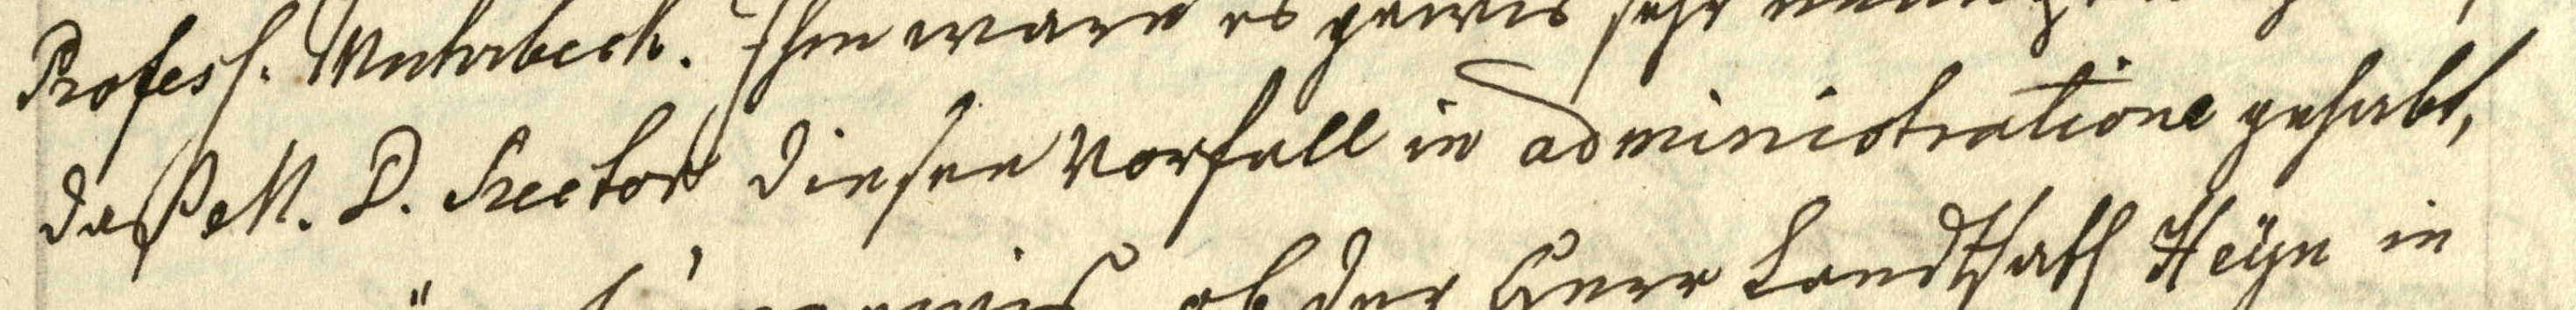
daß M. D. Rector diesen Vorfall in administratione gehabt,
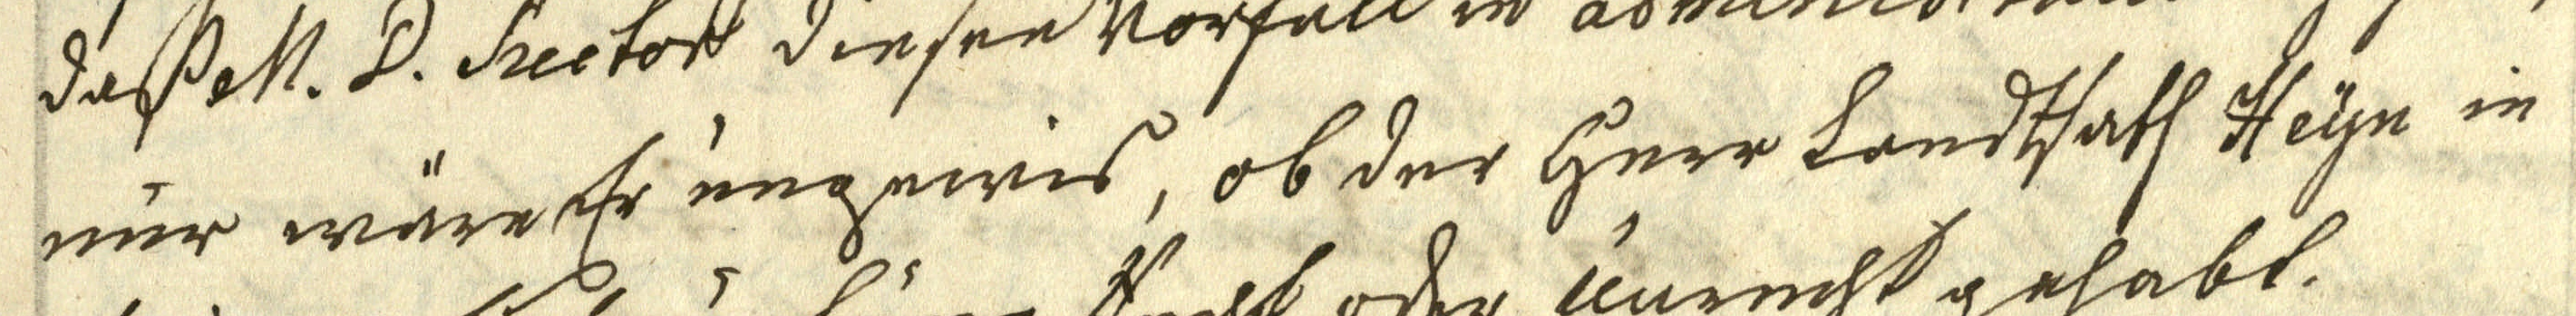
nur wäre Er ungewis, ob der Herr LandRath Heÿn in
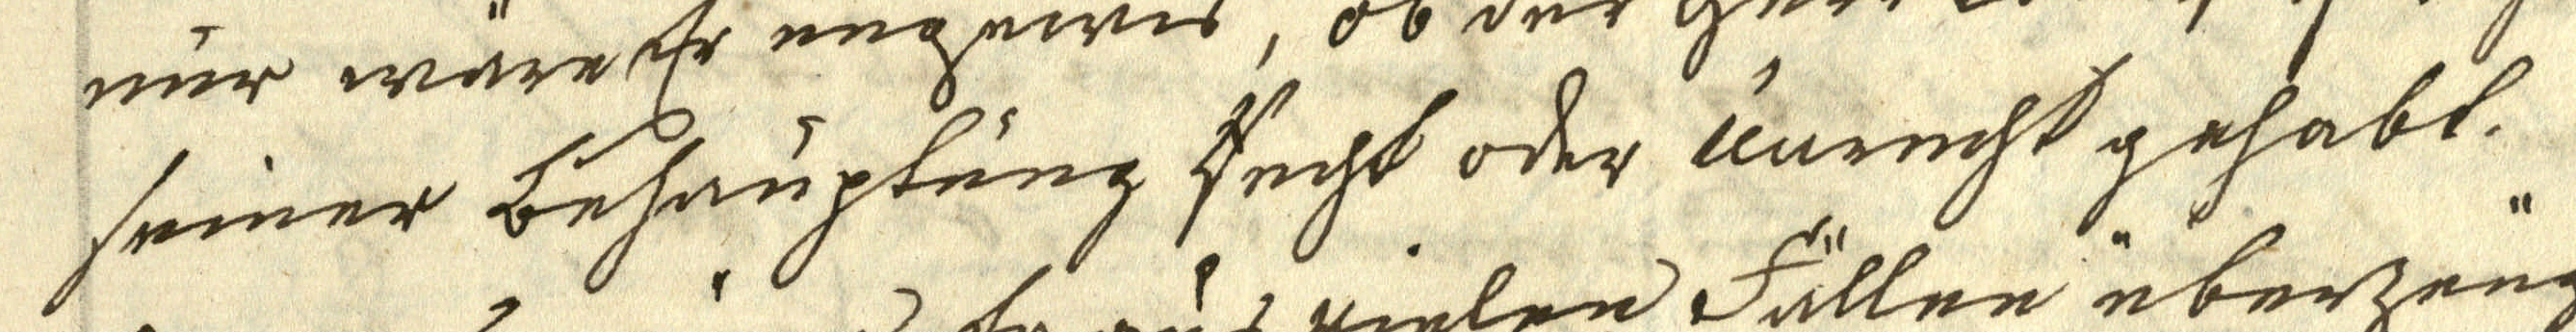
seiner Behauptung Recht oder Unrecht gehabt.
